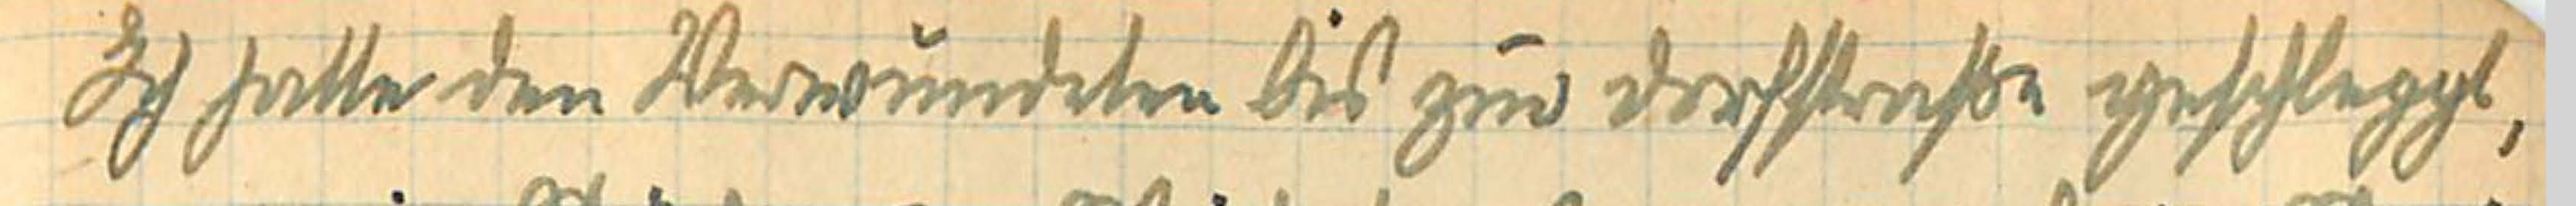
Ich hatte den Verwundeten bis zur Dorfstraße geschleppt,
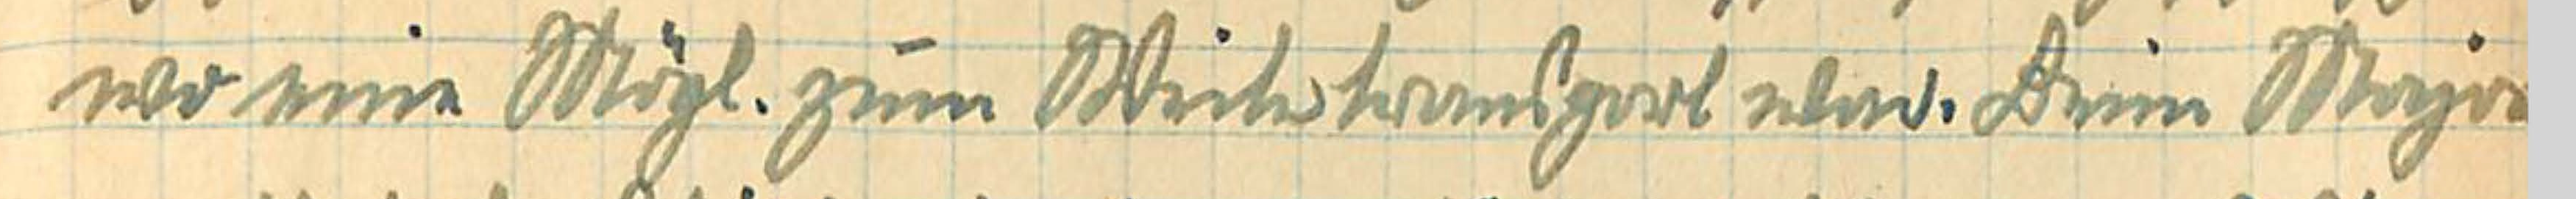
wo eine Mögl. zum Weitertransport war. Beim Major
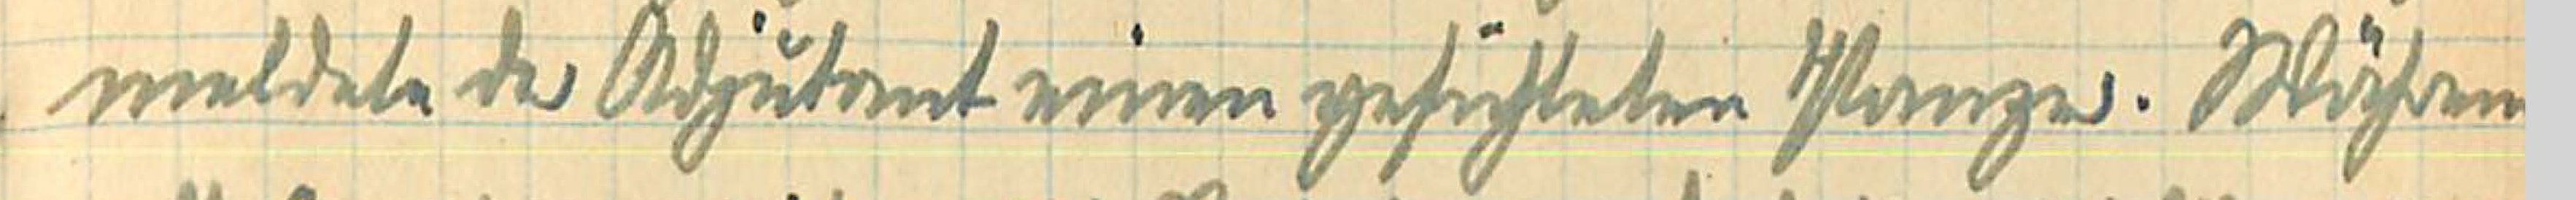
meldete der Adjutant einen gesichteten Panzer. Während
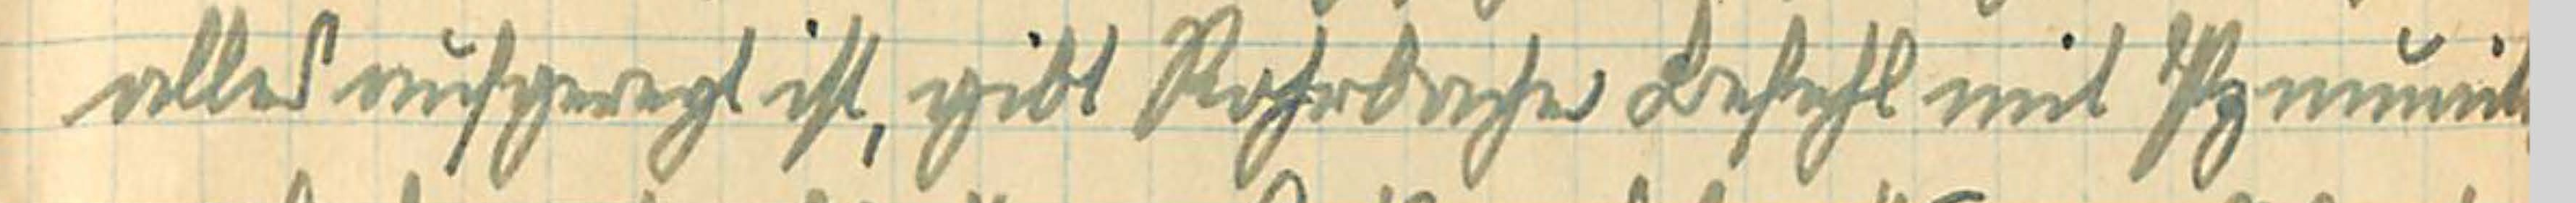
alles aufgeregt ist, gibt Rohrbacher Befehl mit Pzmunition
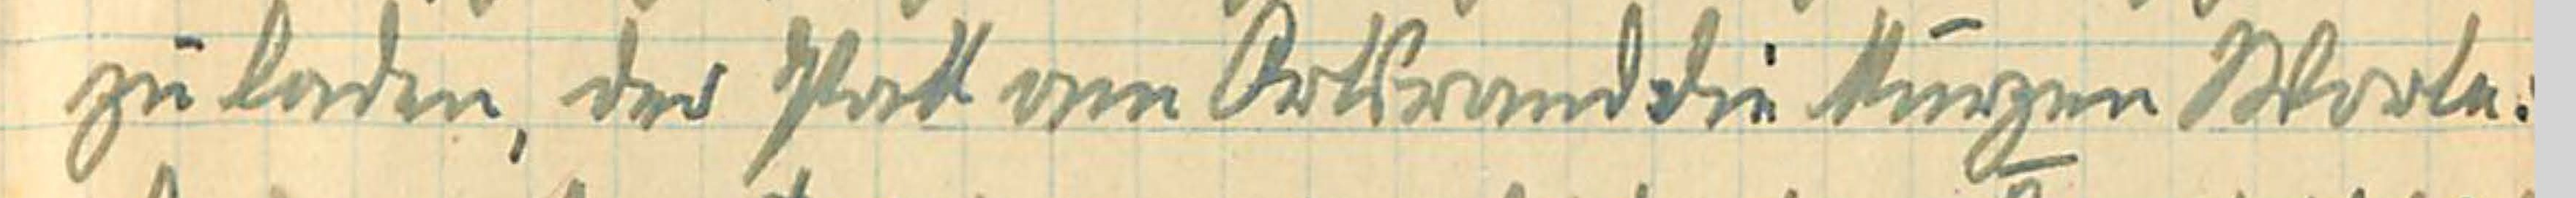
zu laden, der Pak am Ortsrand die kurzen Worte:
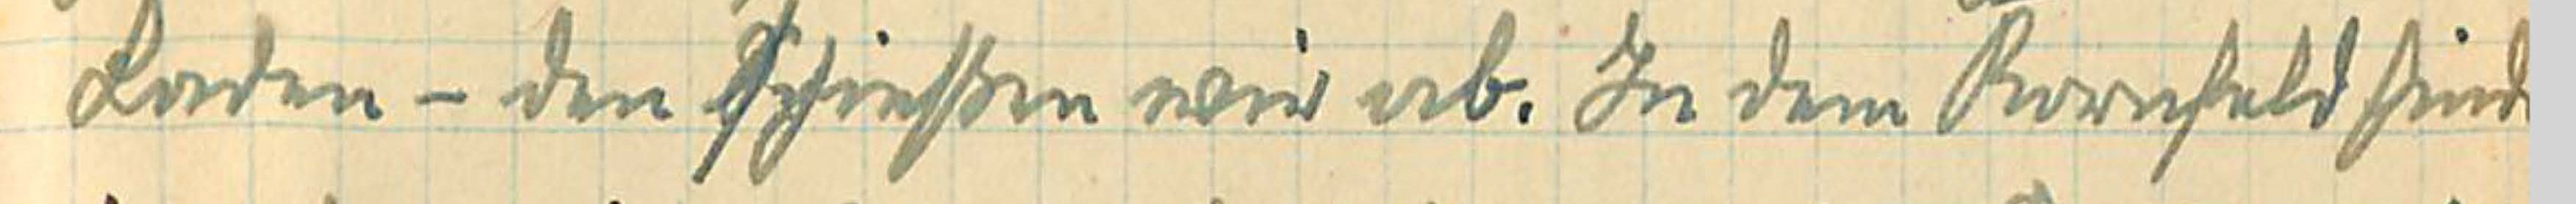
Laden – den schießen wir ab. In dem Kornfeld finde
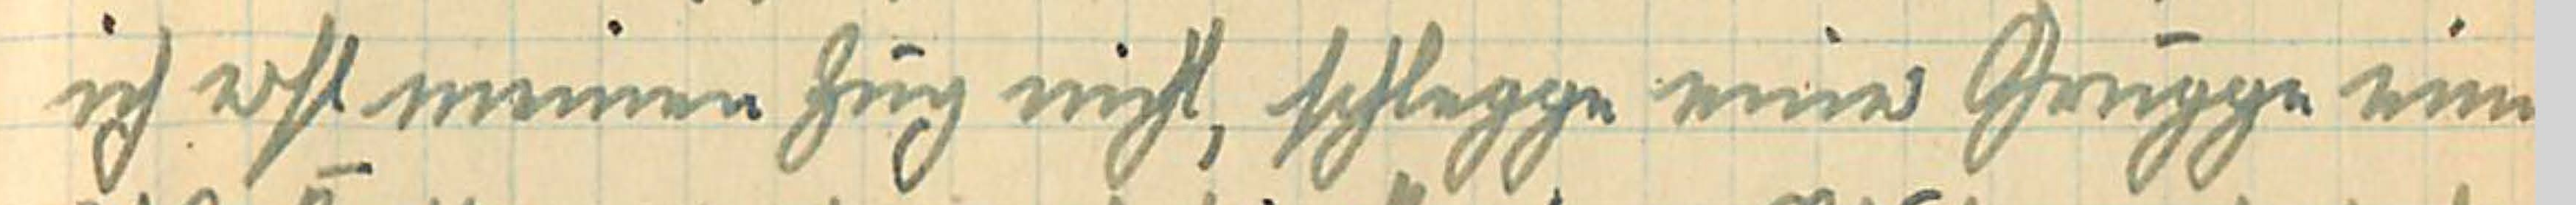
ich erst meinen Zug nicht, schleppe einer Gruppe einen
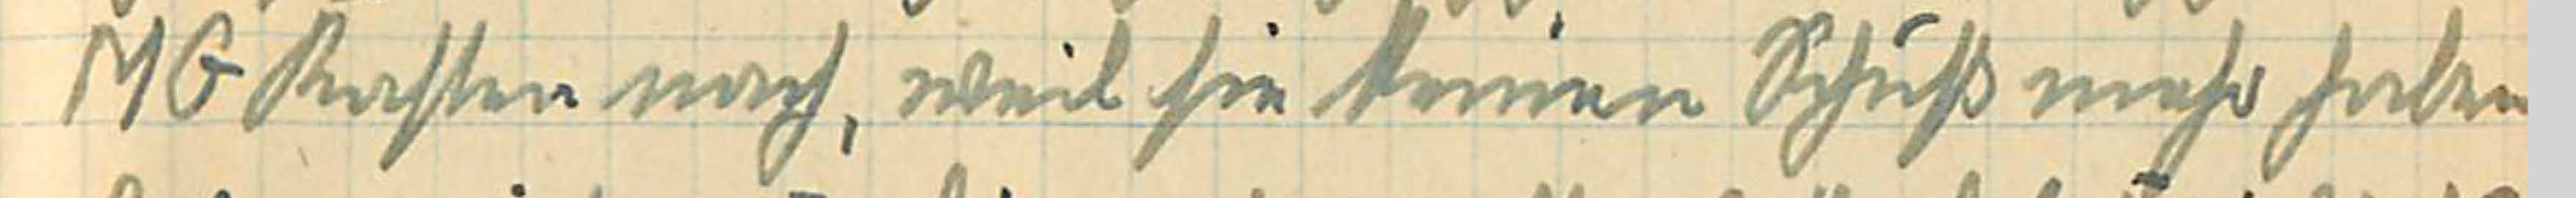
MG Kasten nach, weil sie keinen Schuß mehr haben
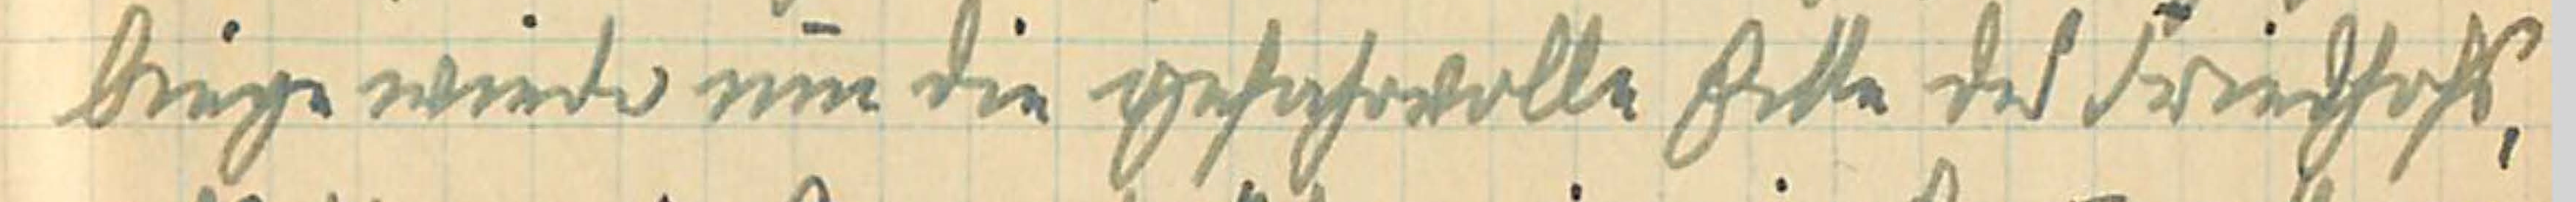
biege wieder um die gefahrvolle Ecke des Friedhofs,
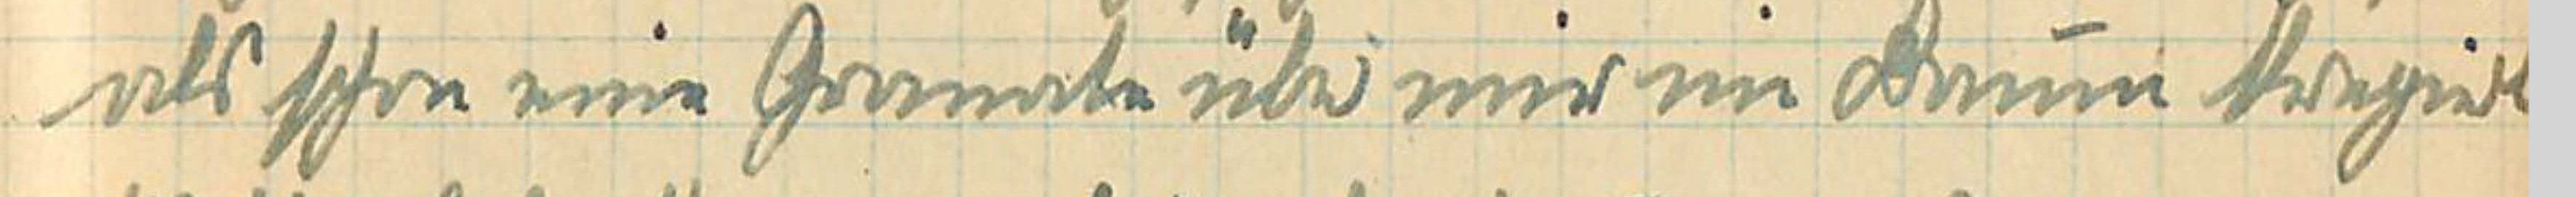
als schon eine Granate über mir im Baum krepierte.
